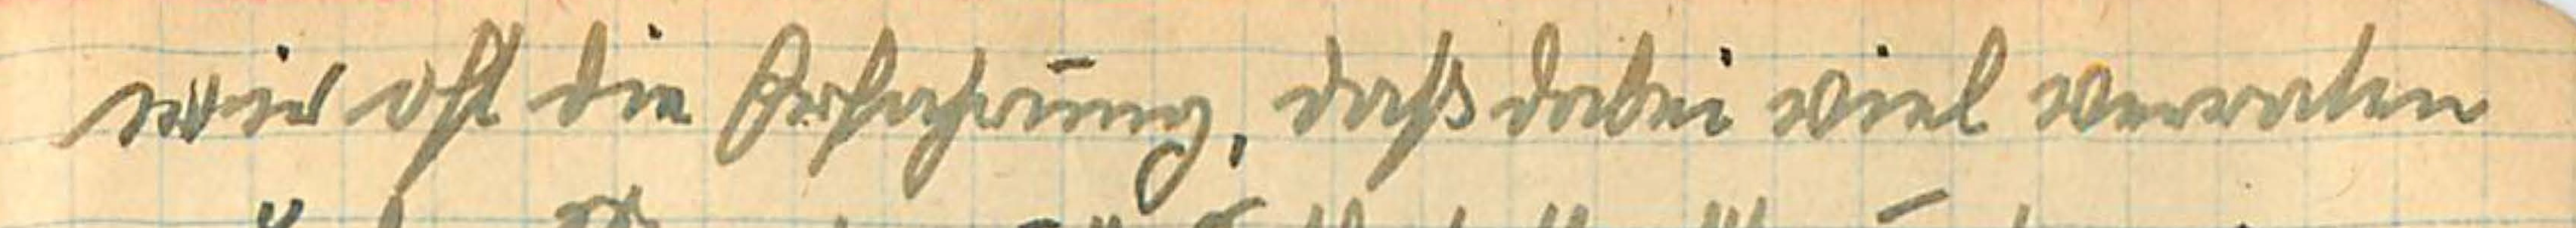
wir oft die Erfahrung, daß dabei viel verraten
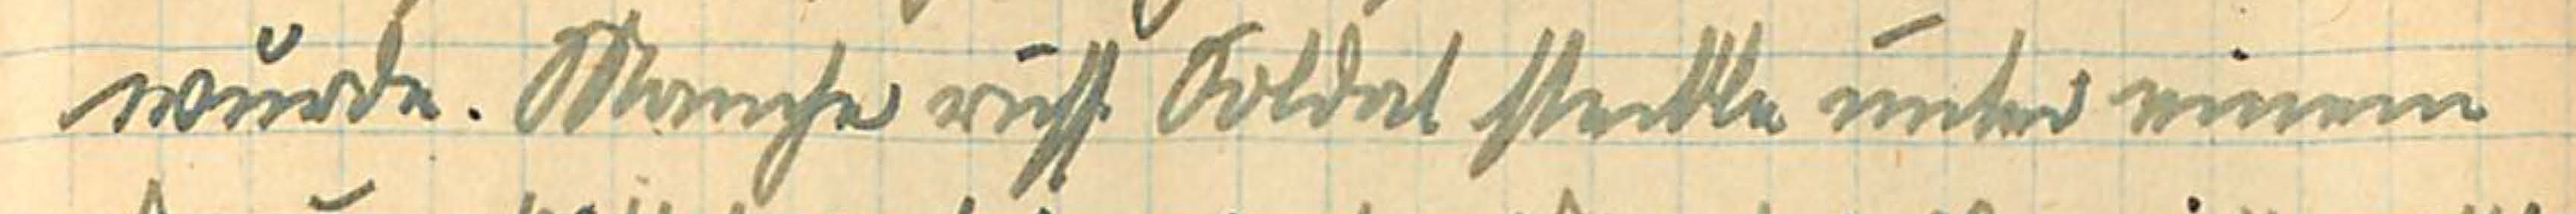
wurde. Mancher russ. Soldat steckte unter einem
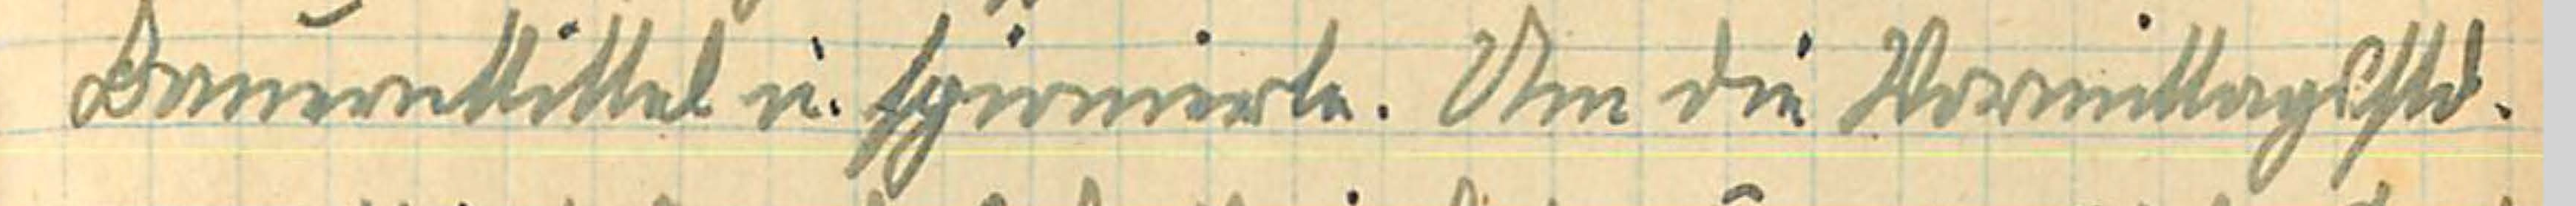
Bauernkittel u. spionierte. Um die Vormittagsstd.
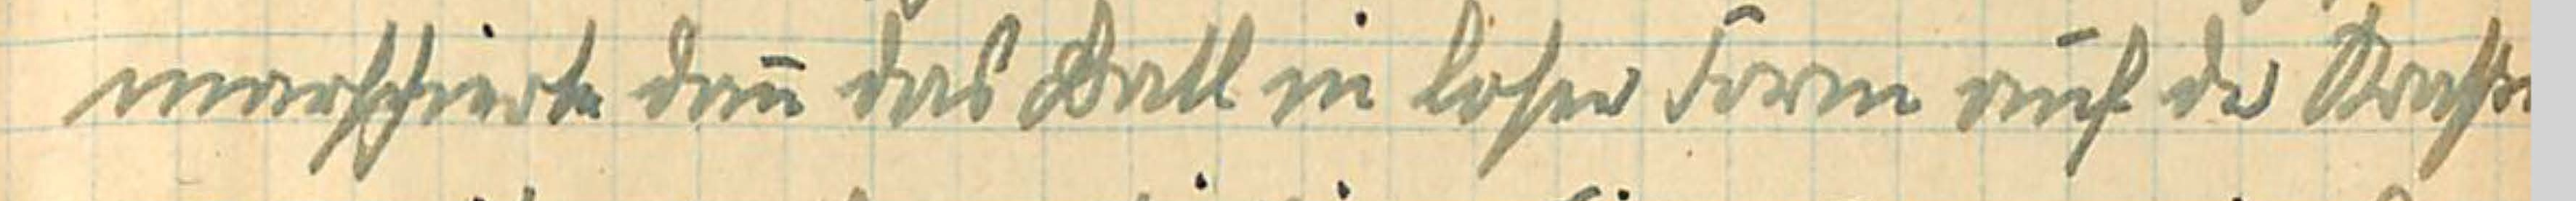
marschierte dann das Batl in loser Form auf der Straße
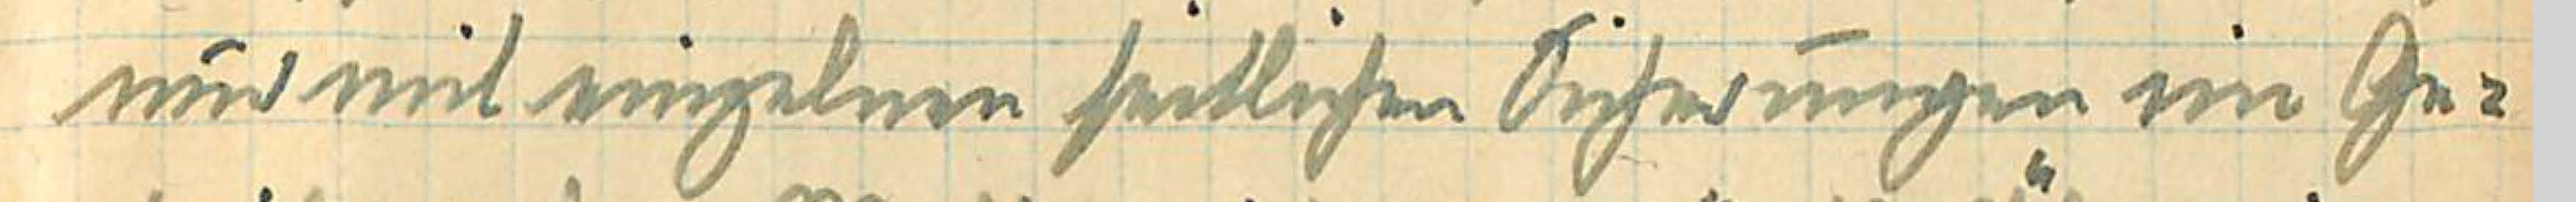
nur mit einzelnen seitlichen Sicherungen im Ge-
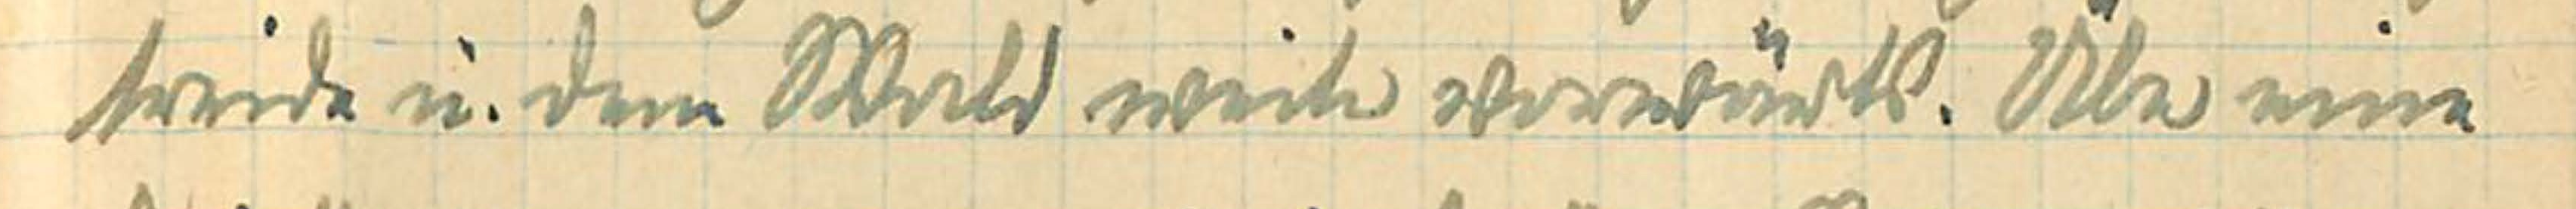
treide u. dem Wald weiter vorwärts. Über eine
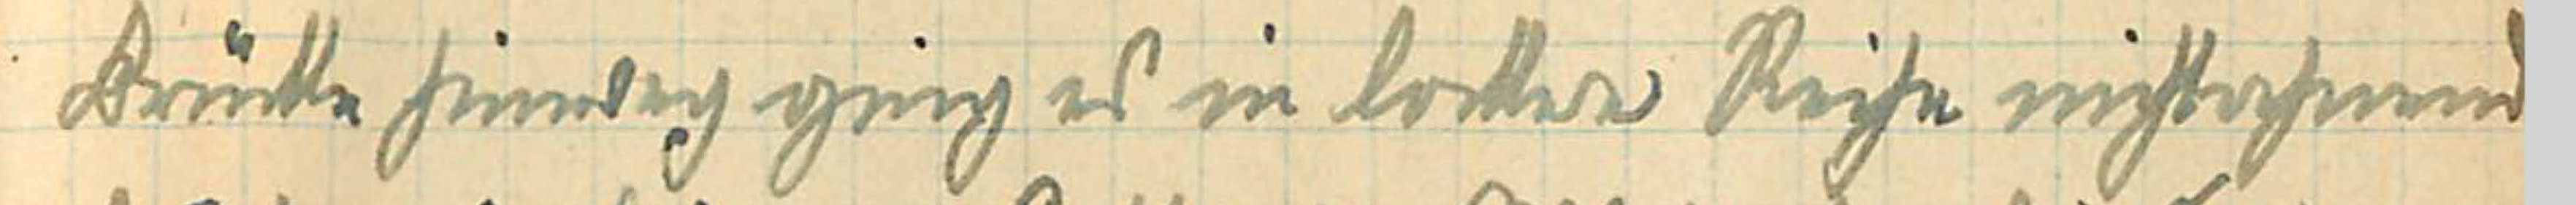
Brücke hinweg ging es in lockerer Reihe nichtahnend
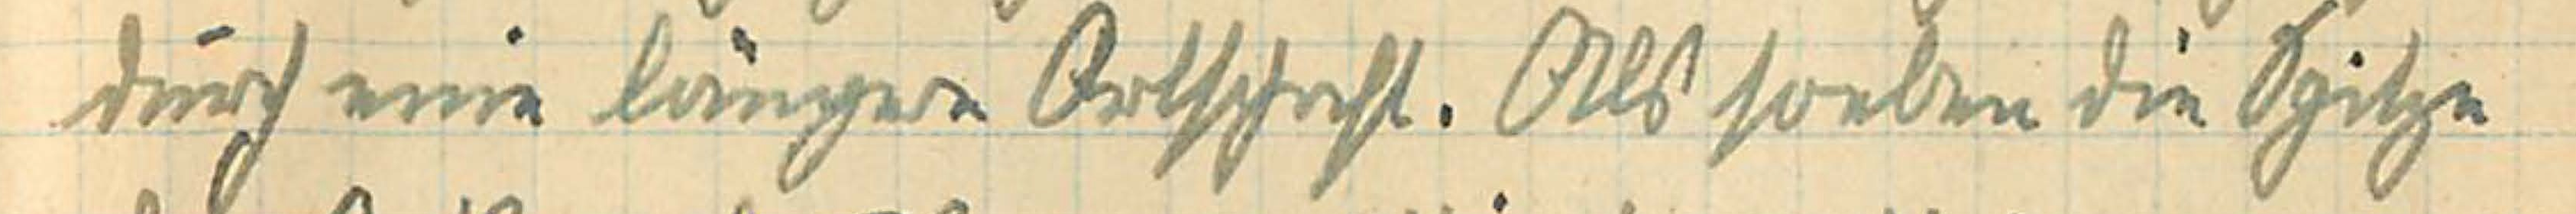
durch eine längere Ortschaft. Als soeben die Spitze
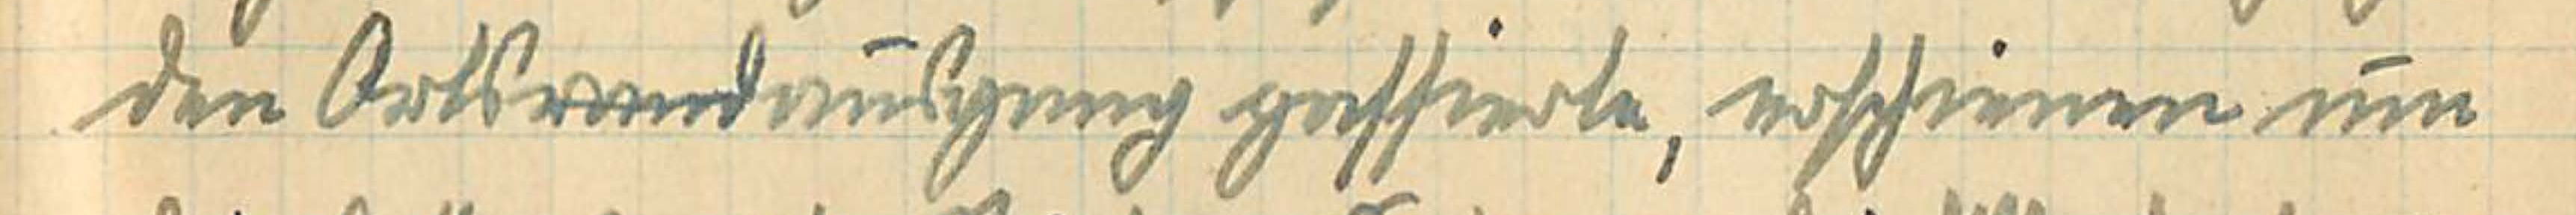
den Ortsrandausgang passierte, erschienen um
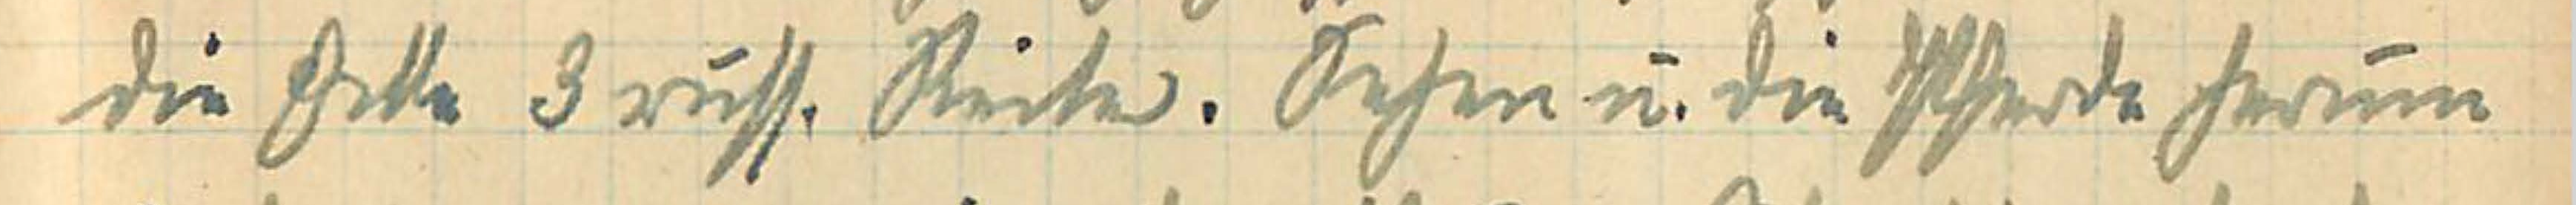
die Ecke 3 russ. Reiter. Sehen u. die Pferde herum
